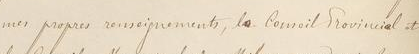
mes propres renseignements, le Conseil Provincial et
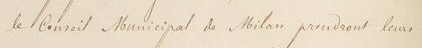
le Conseil Municipal de Milan prendront leurs
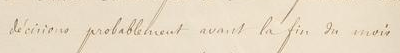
décisions probablement avant la fin du mois
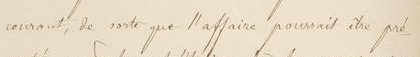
courant, de sorte que l'affaire pourrait être pré-
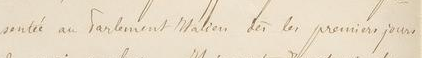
sentée au Parlement Italien dès les premiers jours
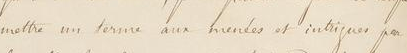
mettre un terme aux menées et intrigues par
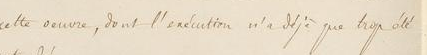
cette oeuvre, dont l'exécution n'a déjà que trop été
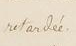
retardée.
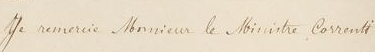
Je remercie Monsieur le Ministre Correnti
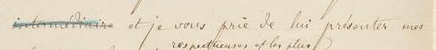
intermédiaire et je vous prie de lui présenter mes
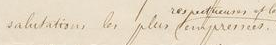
respectueuses et les plus empressées.
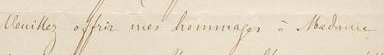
Veuillez offrir mes hommages à Madame
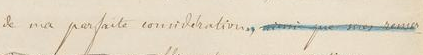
de ma parfaite considération, ainsi que mes remer-
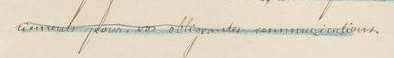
ciements pour vos obligeantes communications.
